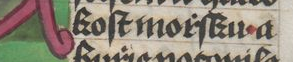koſt moṙſku.a
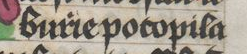buṙie potopila
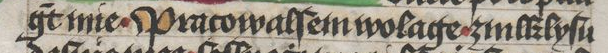ḡt mie.Pracowalſem wolage.zmlklyſu
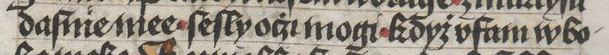daſnie mee.ſeſly oċi mogi.kdyż vfani wbo¬
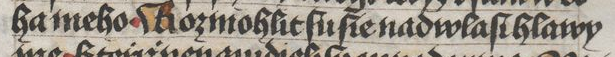ha meho.Rozmohlit ſu sie nadwlaſi hlawy
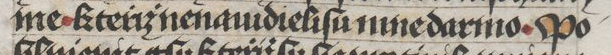me.kteṙiż nenauidieliſu mne darmo.Po¬
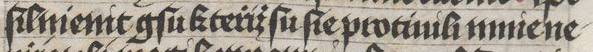ſilnienit gſu kteṙiż ſu ſie protiuili mnie ne¬
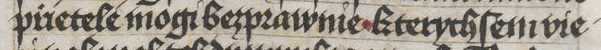pṙíetelé mogi bezprawnie.kterych ſem vie¬
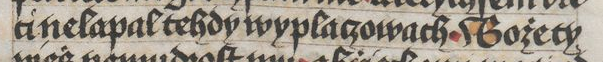ci nelapal tehdy wyplaczowach.Boże ty
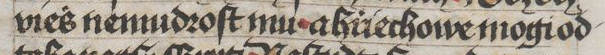vieṡ nemudroſt mu.a hṙiechowe mogi od¬
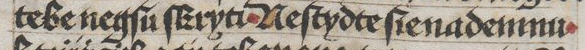tebe negſu ſkryti.Neſtydte ſie nademnu.
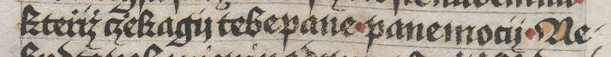kteṙiż cżekagii tebe pane.panemocij.Ne¬
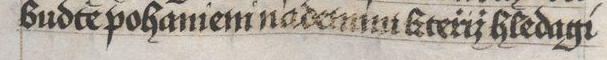buḋte pohanieni nademnu kteṙíž hledagí
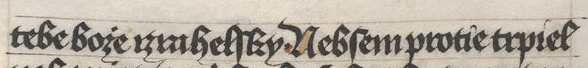tebe boże izrahelſky.Nebſem protie trpiel
